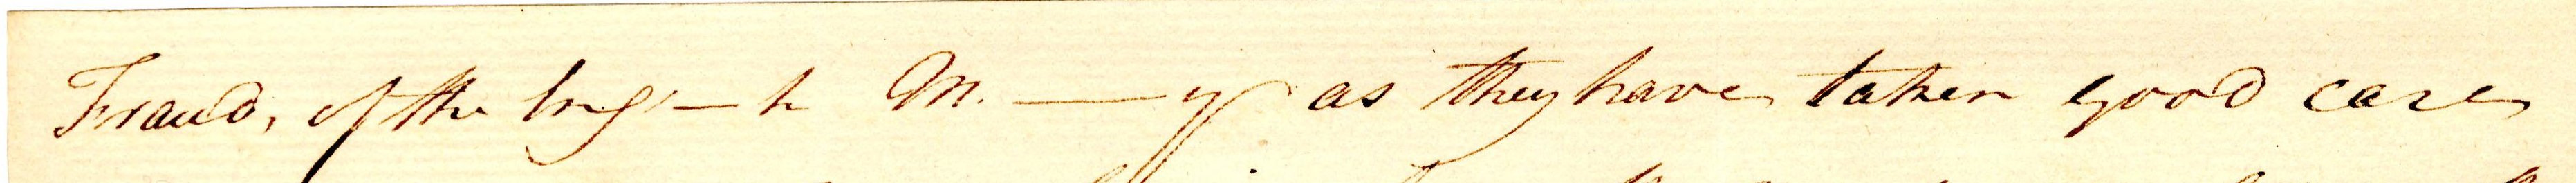Fraud, of the Eng-h M-y as they have taken good care
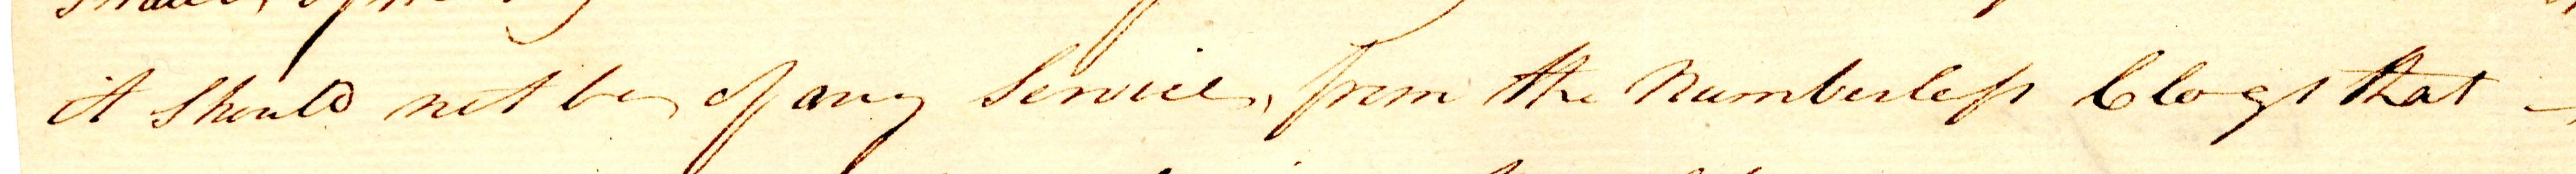it should not be of any service, from the Numberless Clogs that
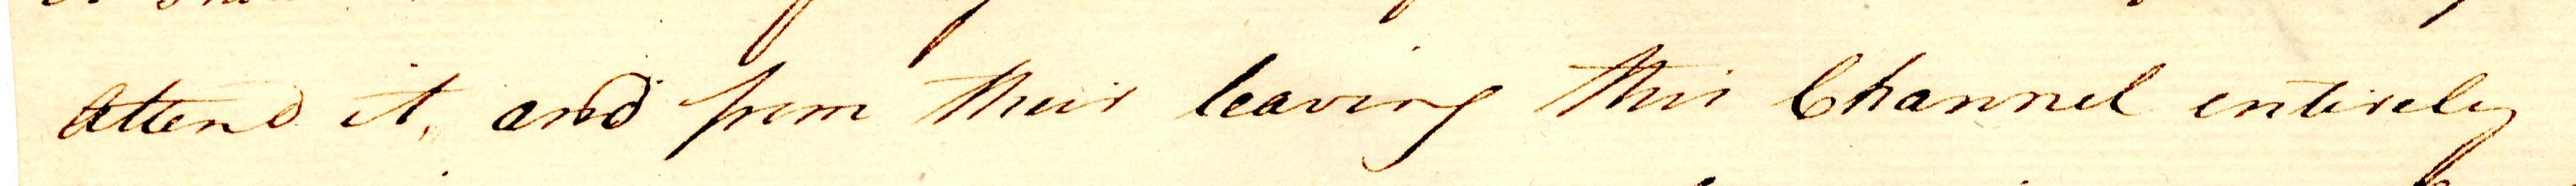Attend it, and from their leaving this Channel entirely
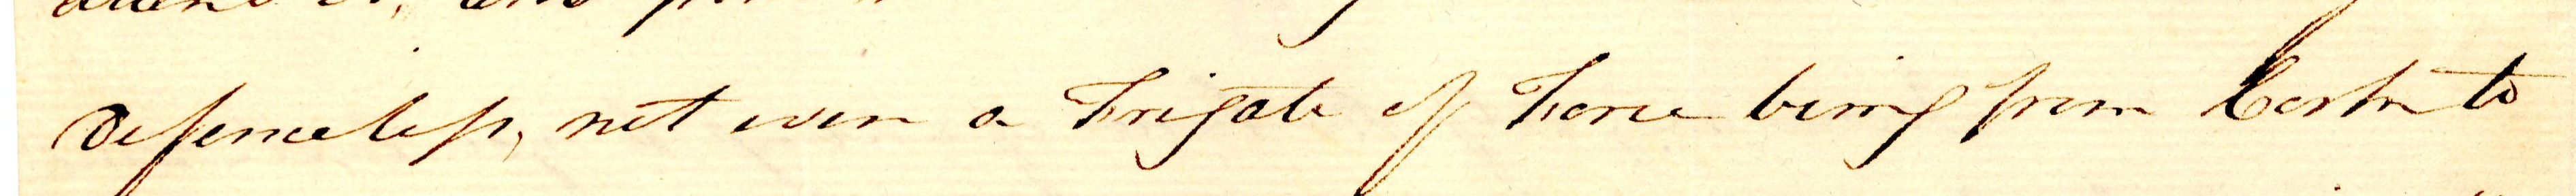defenceless, not even a Frigate of Force being from Cork to
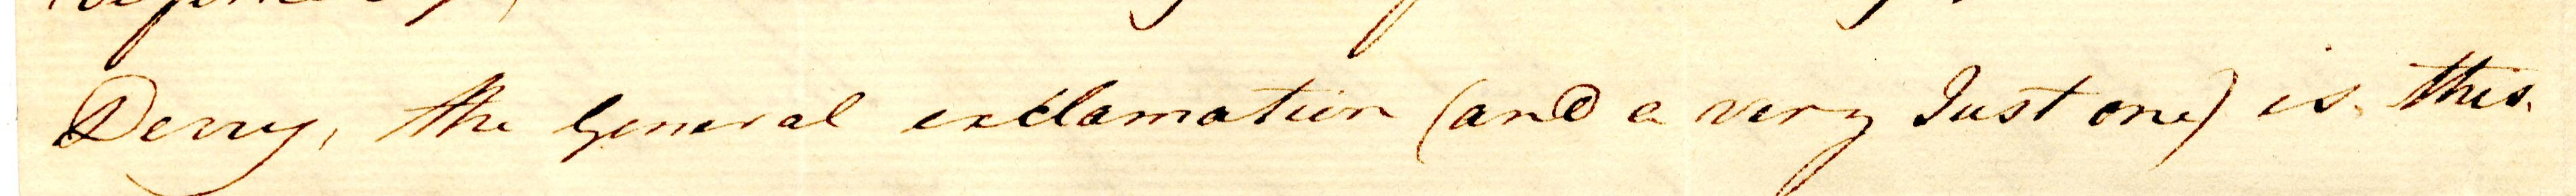Derry, the General exclamation (and a very Just one) is this.
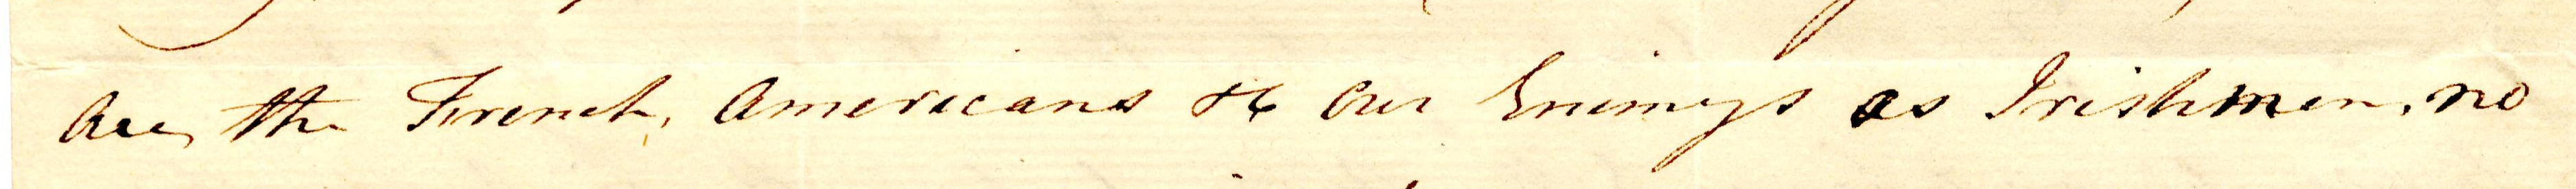are the French Americans &c our Evenings as Irishmen, no
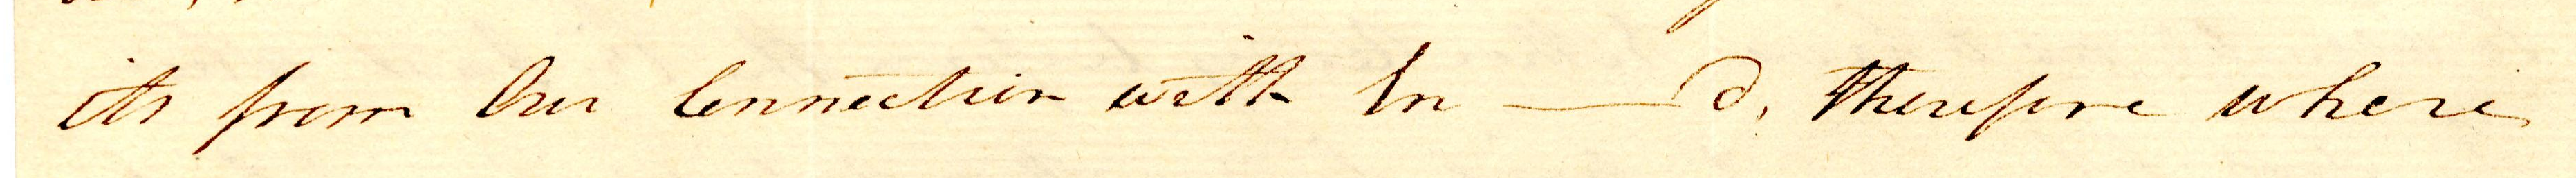its from Our Connection En-d, therefore where
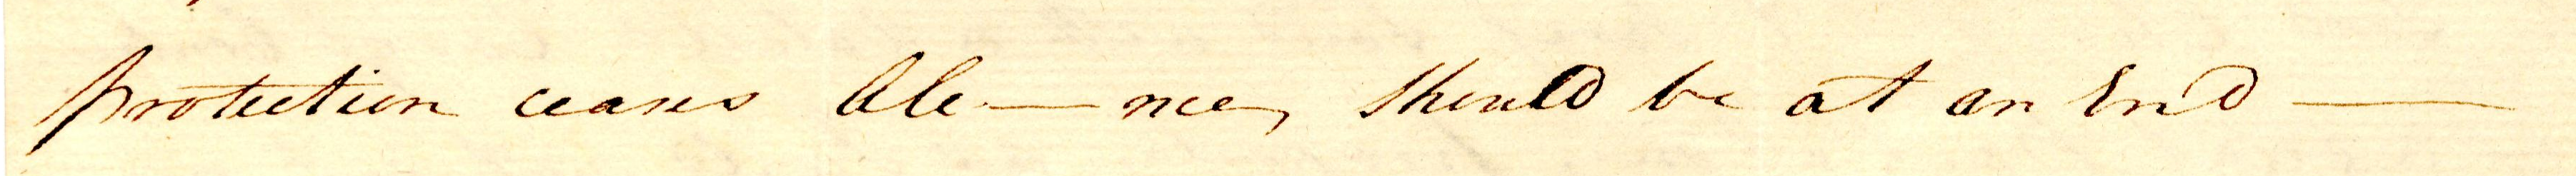protection ceases Ale-nce, should be at an End-
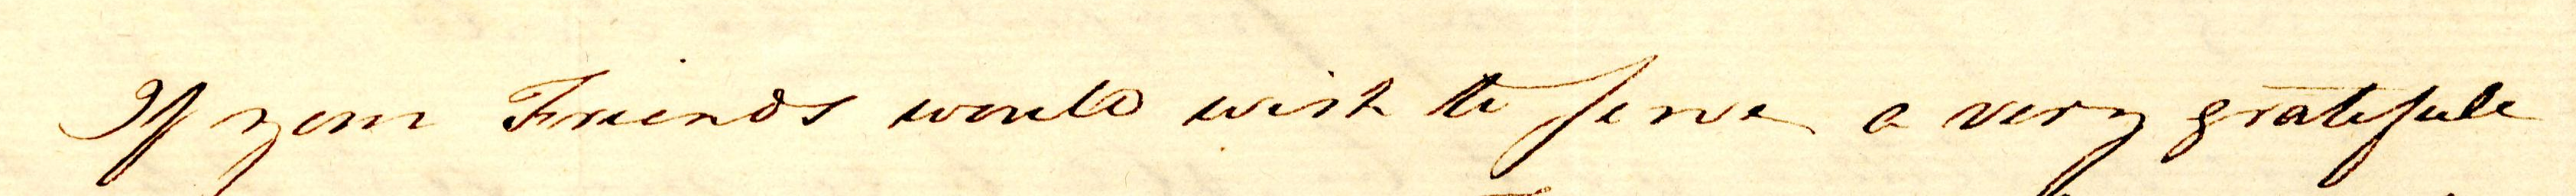If you Friends would wish to a very gratefull
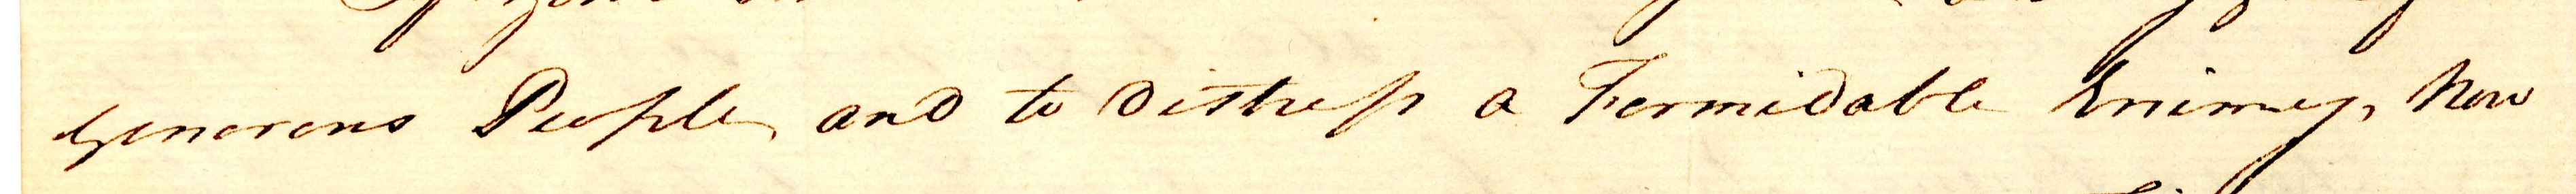Generous People and to distress a Formidable Enimy, now
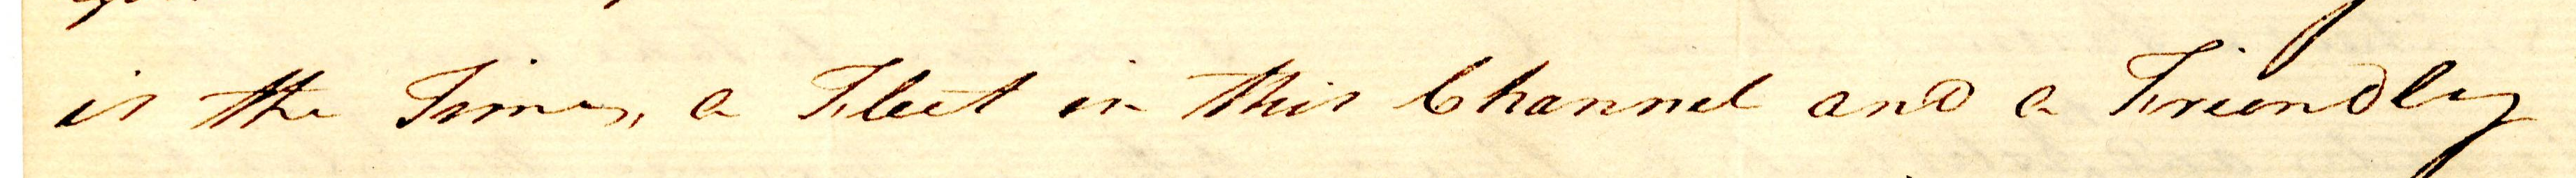is the Time, a Fleet in their Channel and a Friendly
